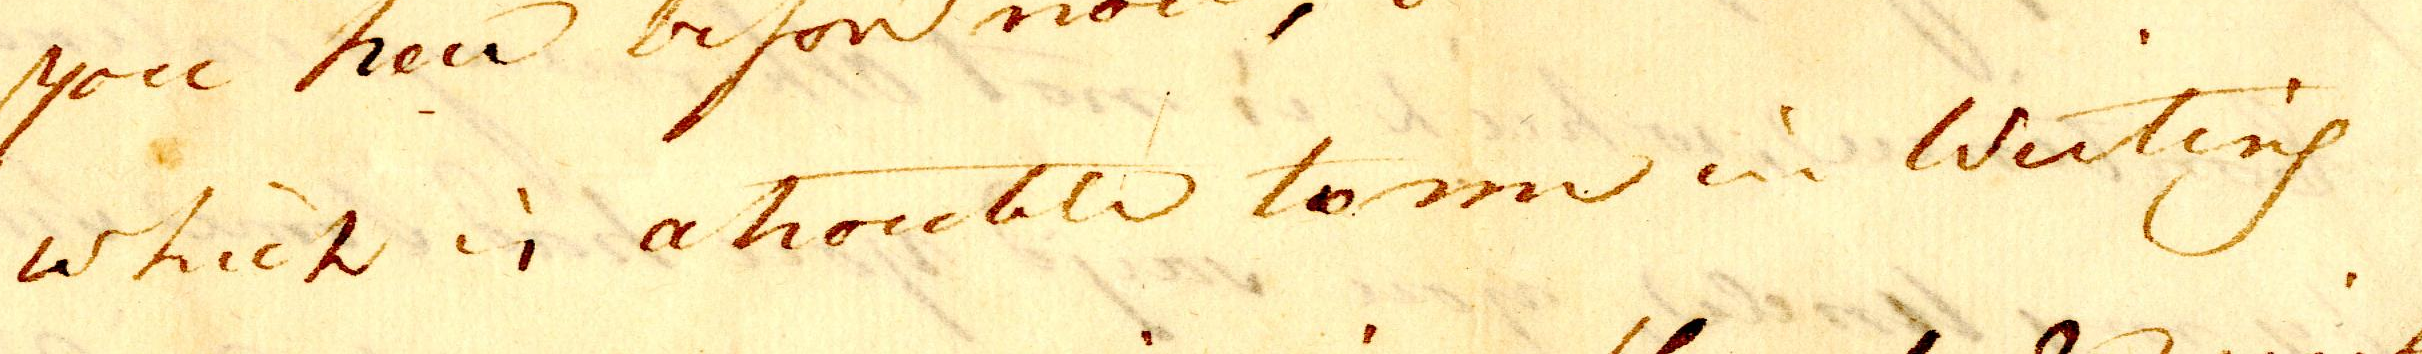which is a trouble to me in Writing
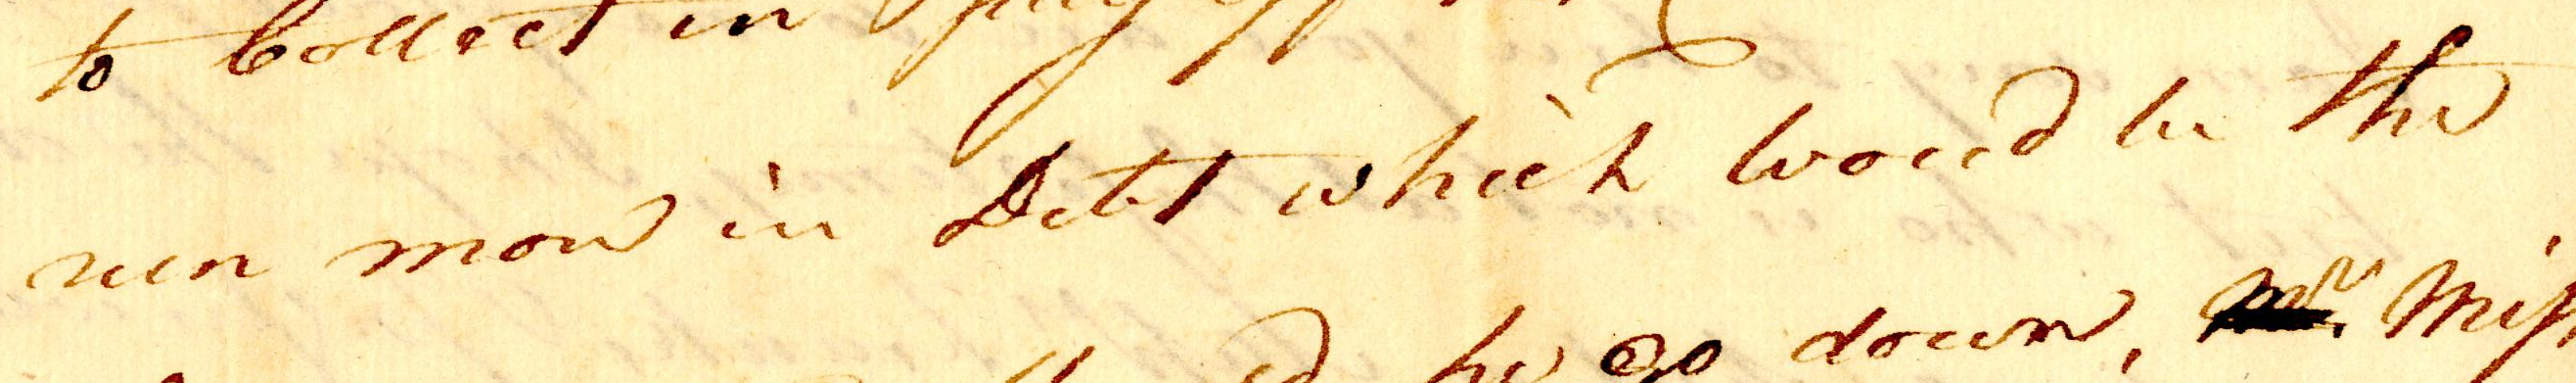seen now in Debt which woud be the
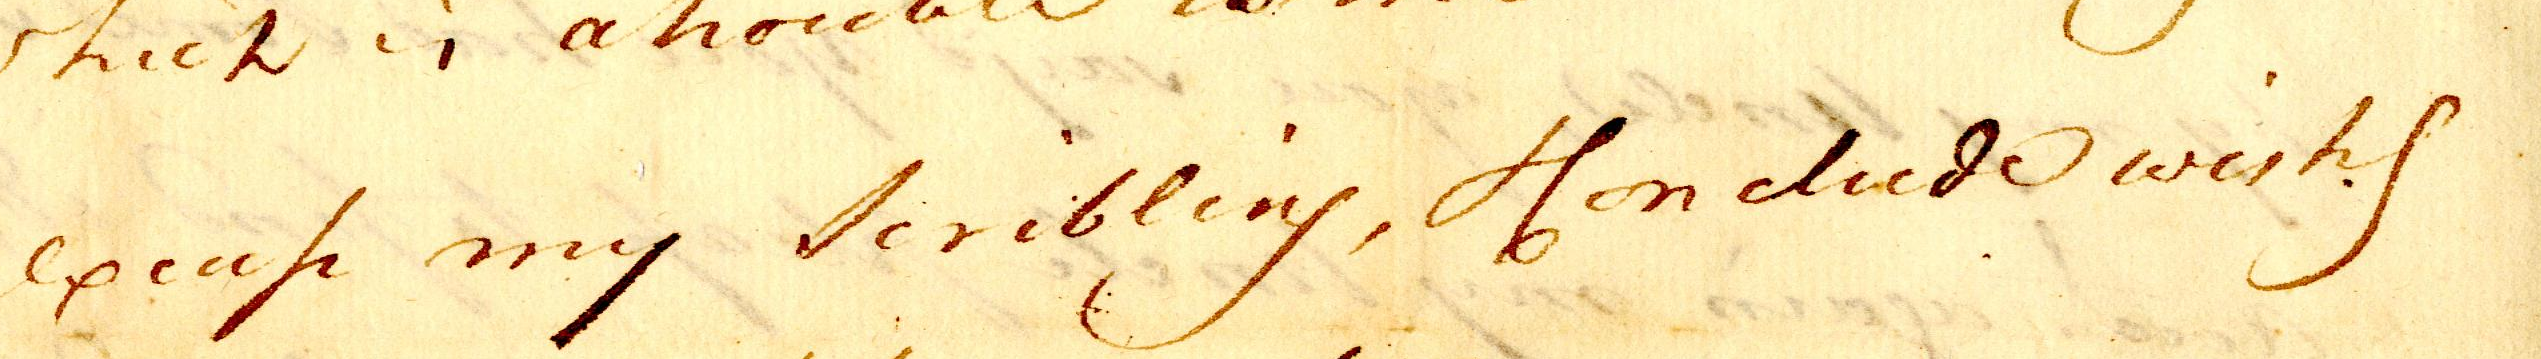excuse my scribbling, & Conclude wish^g
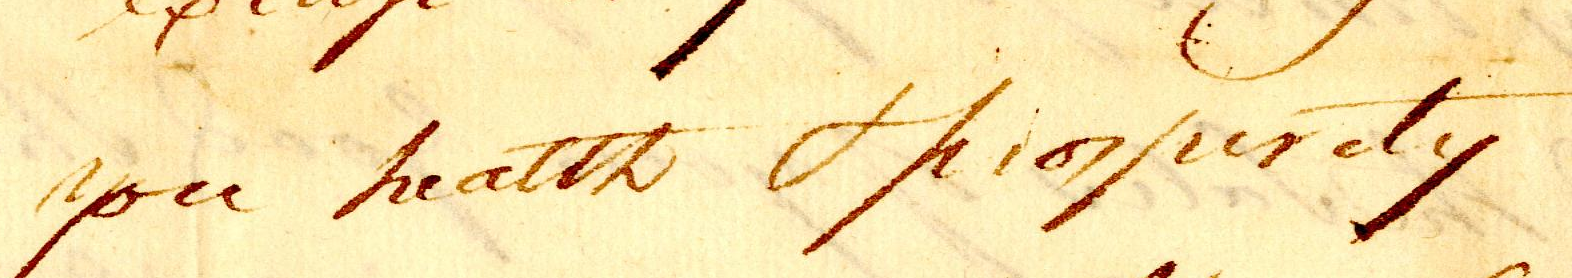you health & prosperity
